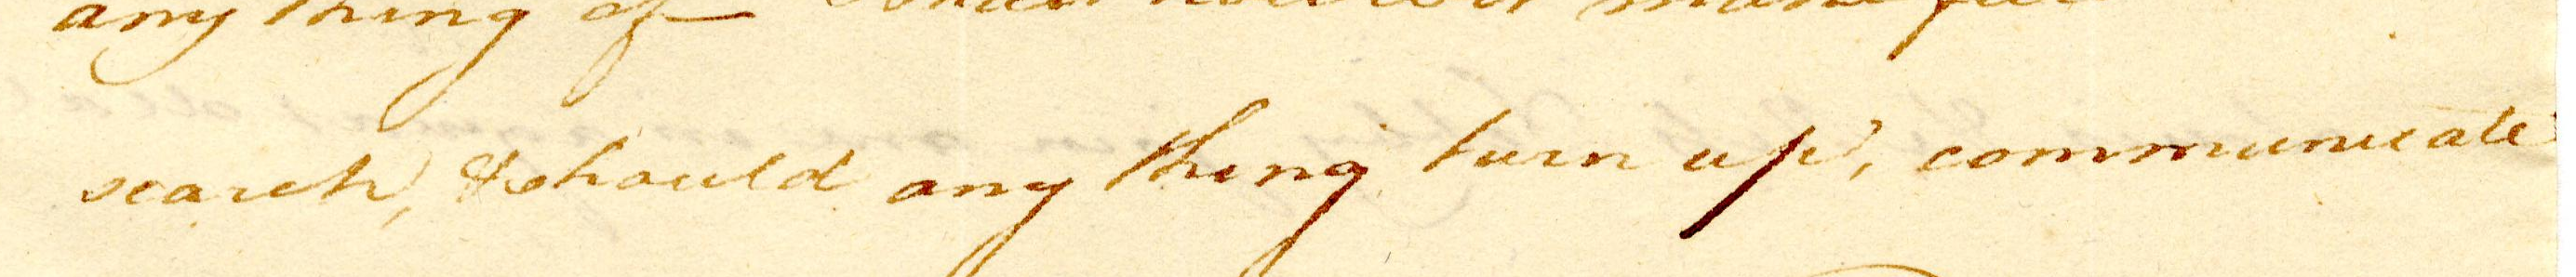search, & should any thing turn up, communicate
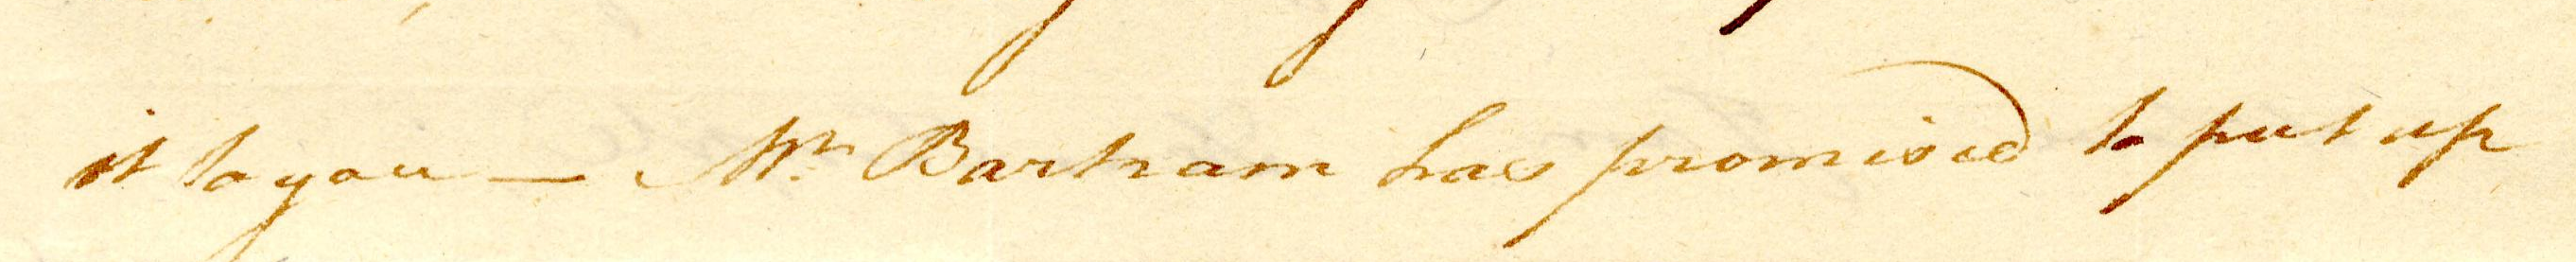it to you- M^r. bartram has promised to put up
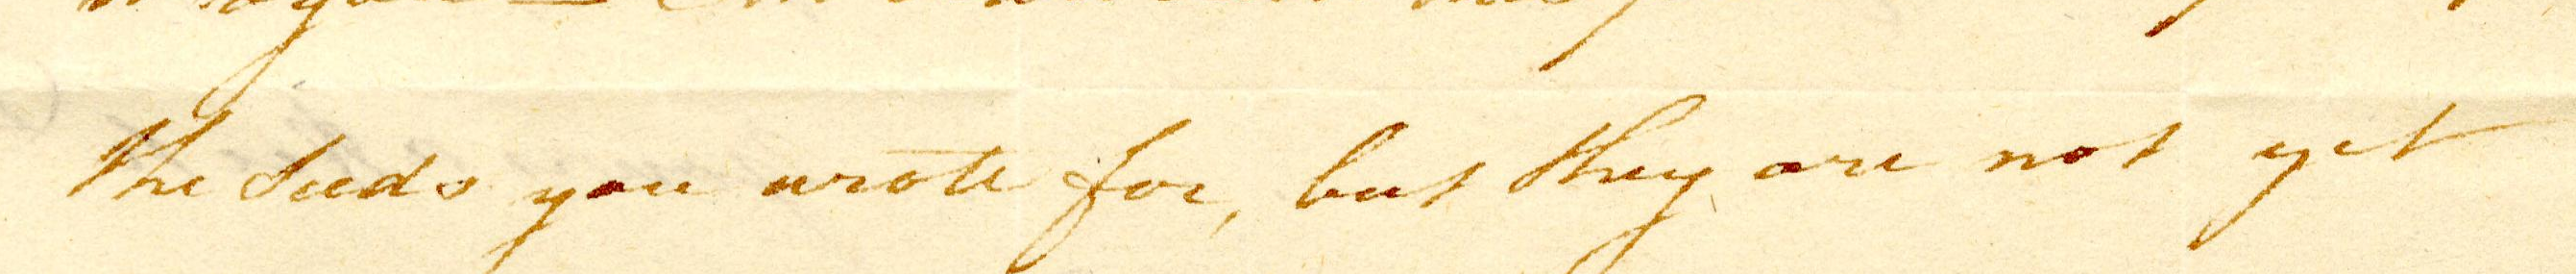the seeds you wrote for, but they are not yet
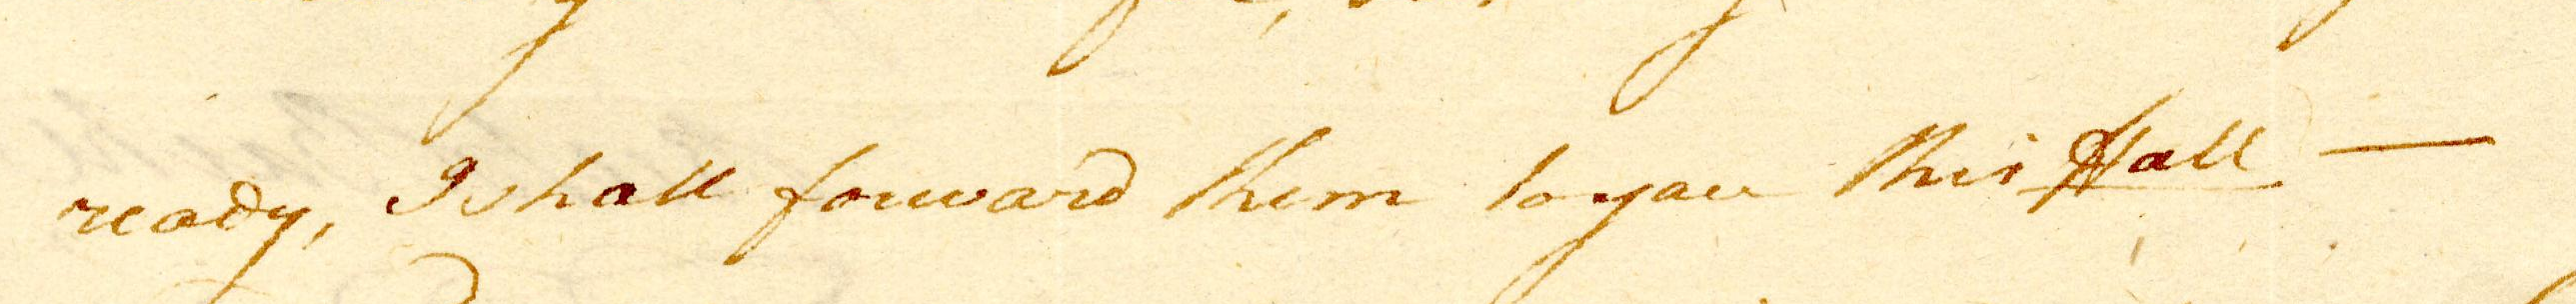ready, I shall forward them to you this Fall-
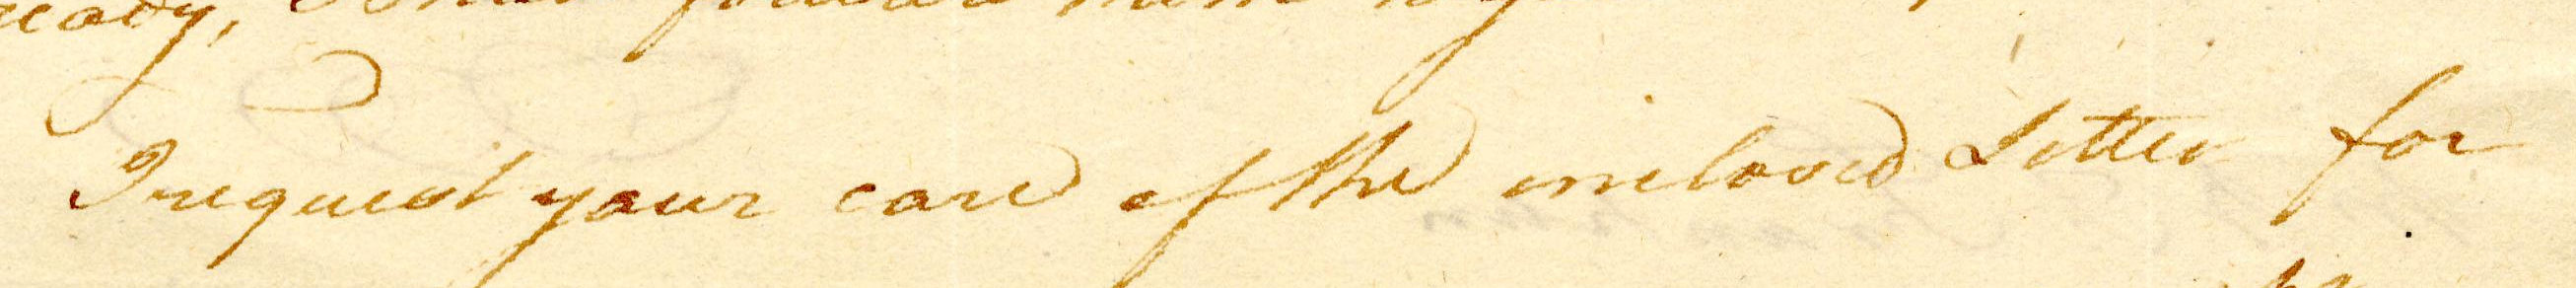I request your care of the inclosed Letter for
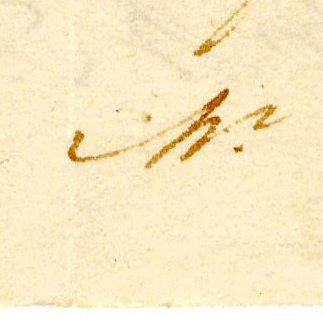M^r.
